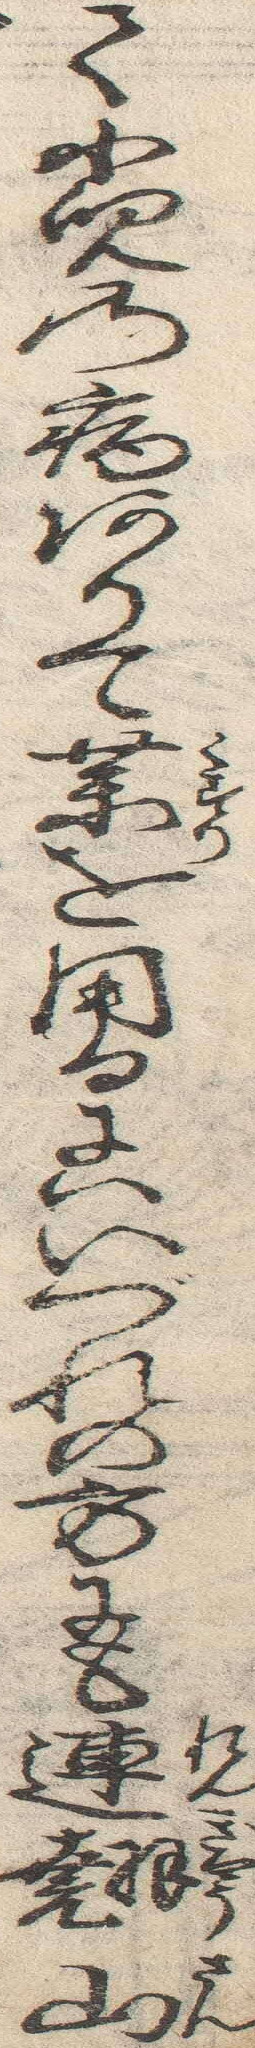て小児の病ありて薬を用るにはいづれの方にも連翹山
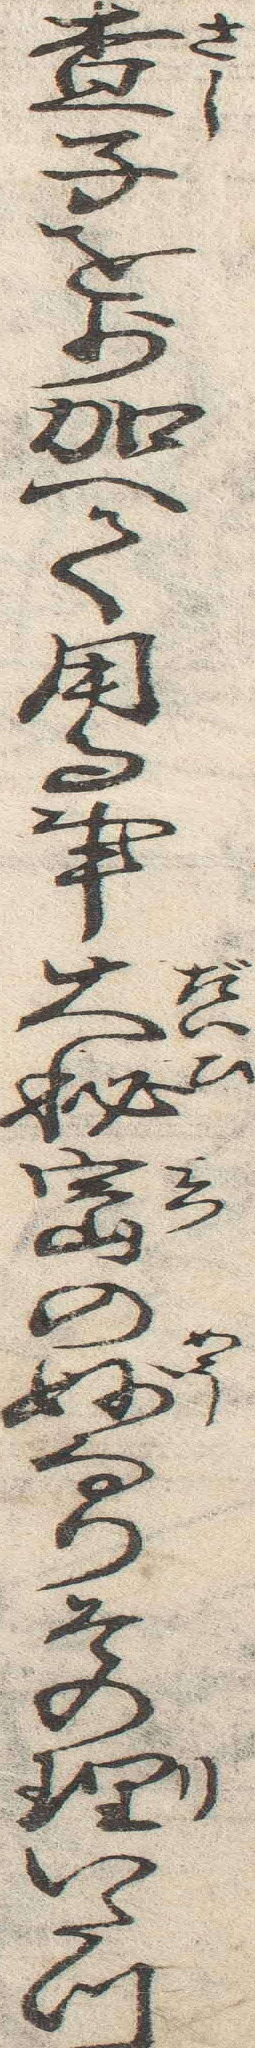査子を少加へて用る事大秘密の妙なりその理いたつ
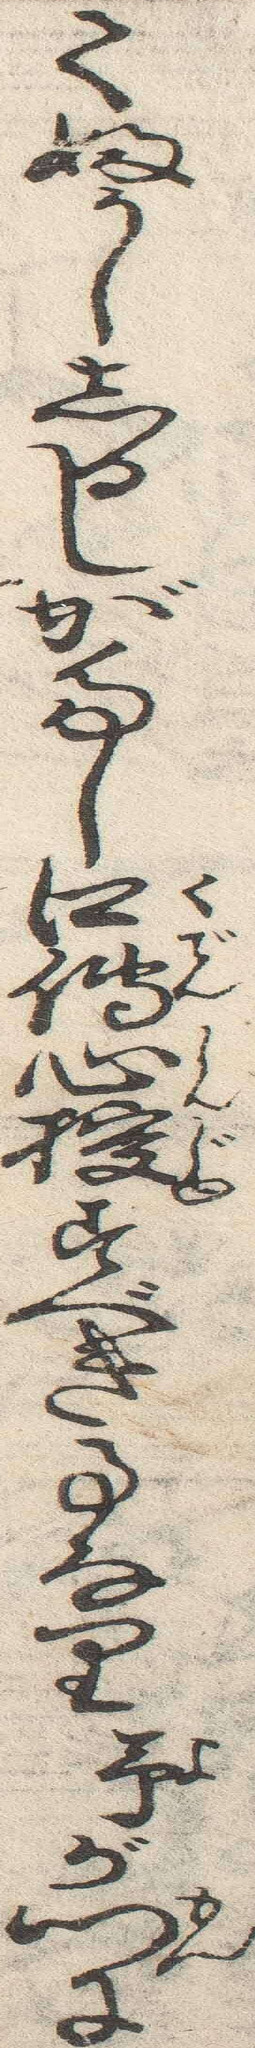てふかししるしが多し口伝心授すべき事なり予が門に
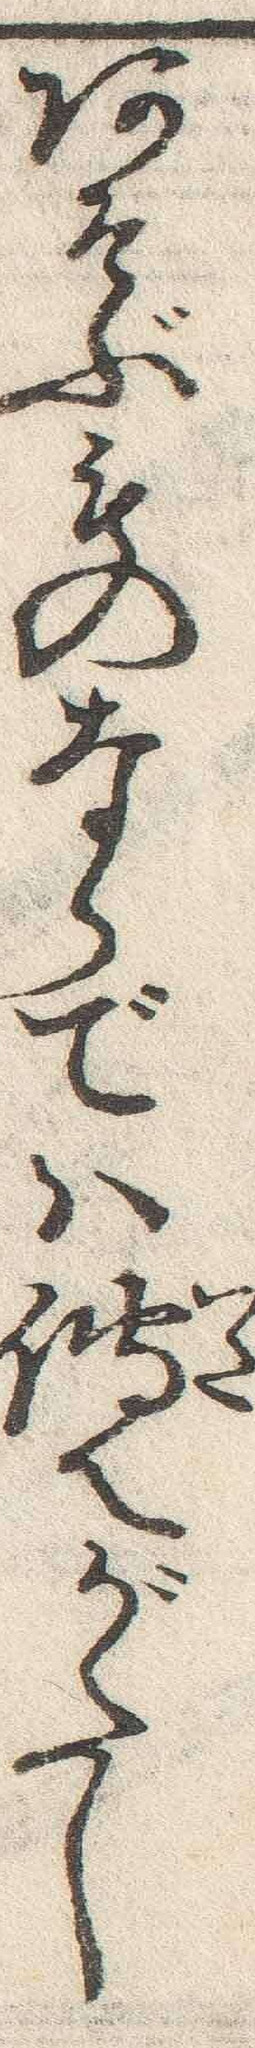あそぶものならでは伝えがたし
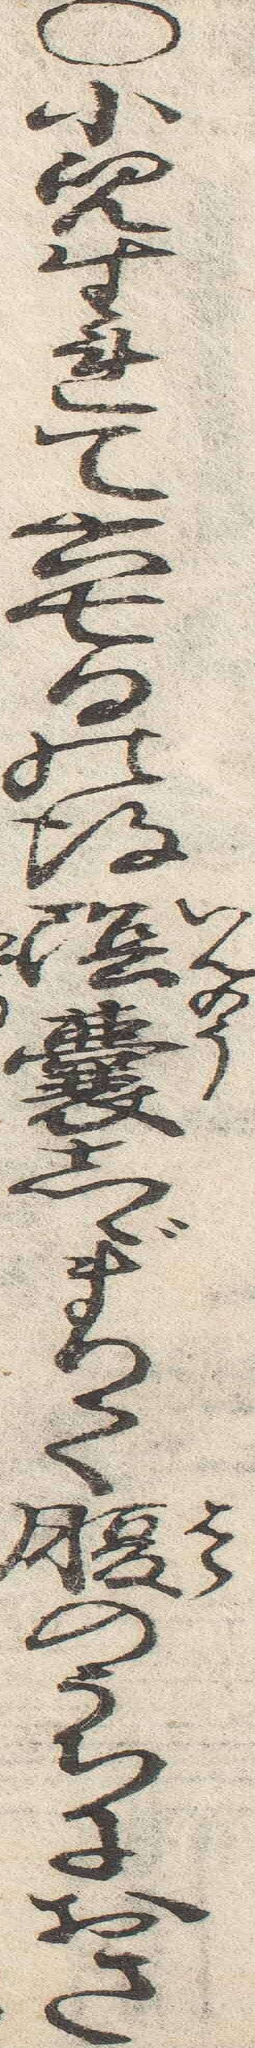○小児生れて六七日の後陰嚢しゞまりて腹のうちにおさ
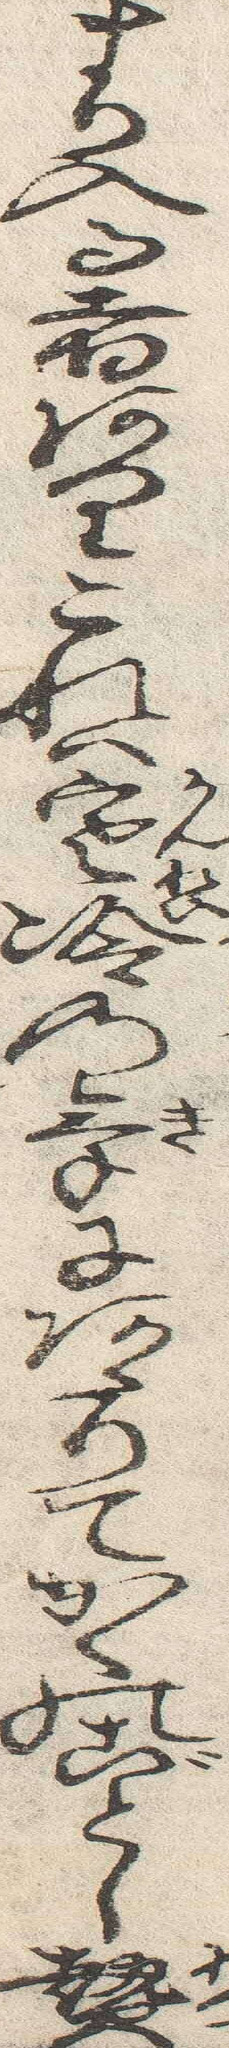まり入る者ありこれは寒冷の気にあたりてかくのごとし熱
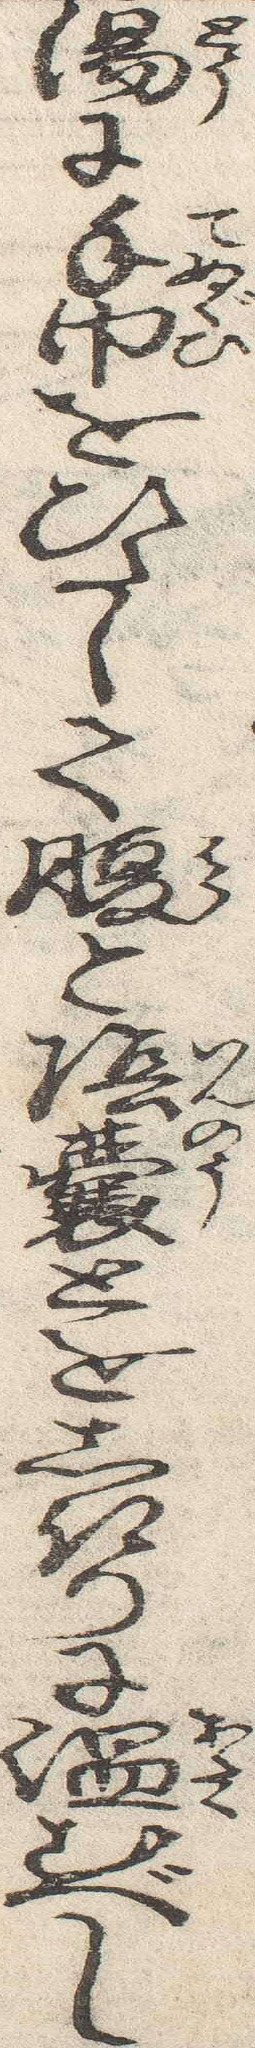湯に手巾をひたして腹と陰嚢とをしきりに温むべし
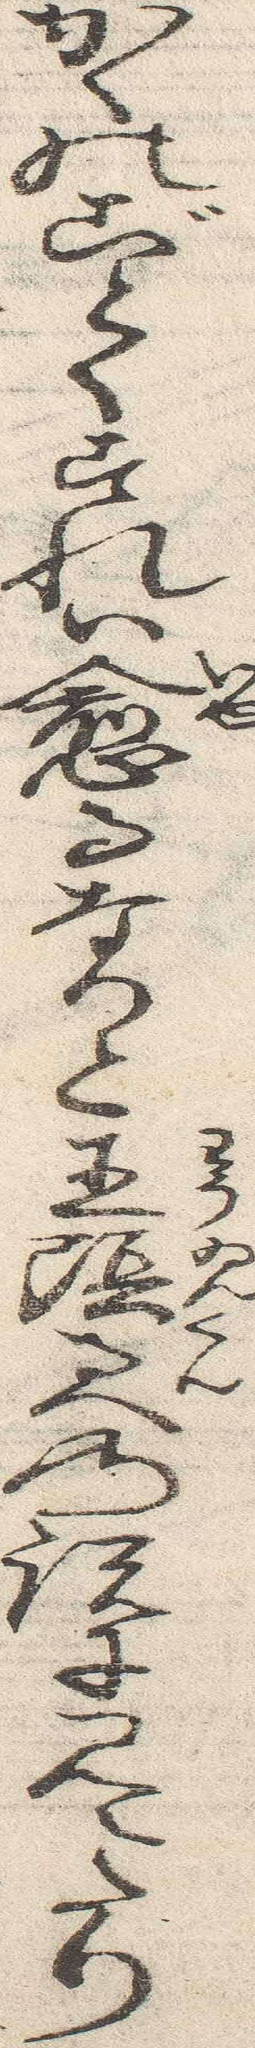かくのごとくすれは愈るなりと王隠君の説に見えたり
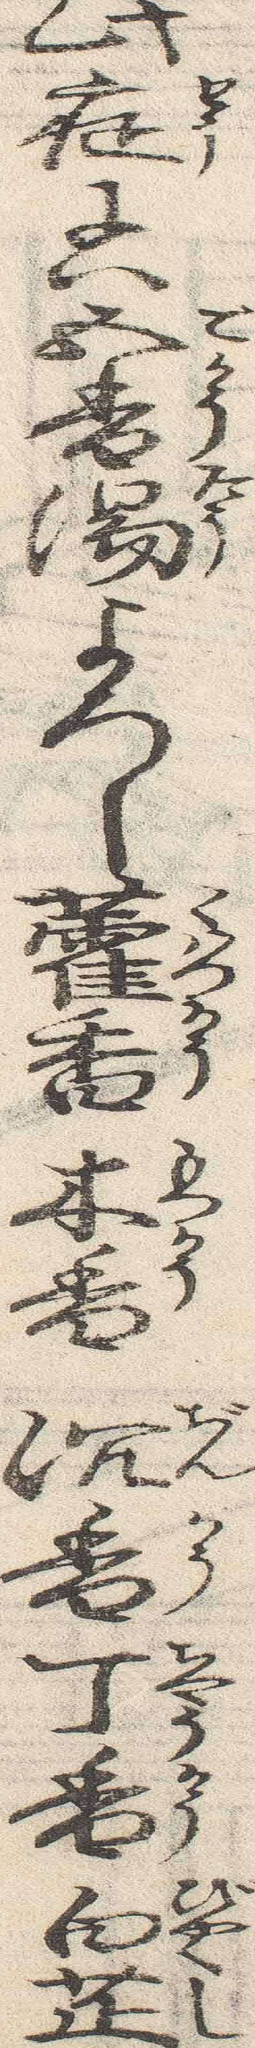此症には五香湯よろし藿香木香沈香丁香白芷
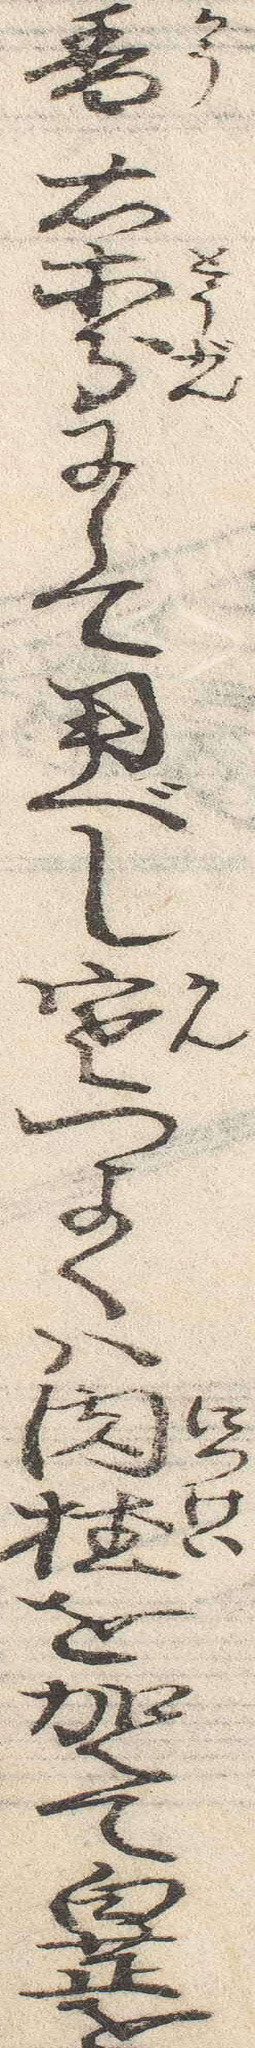香右等分にして用べし寒つよくは肉桂を加えて白芷を
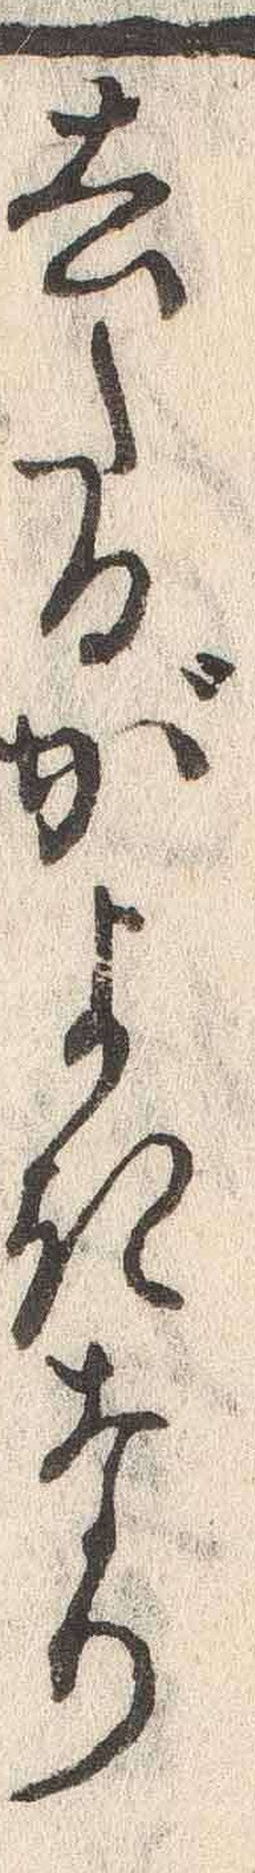去たるがよきなり
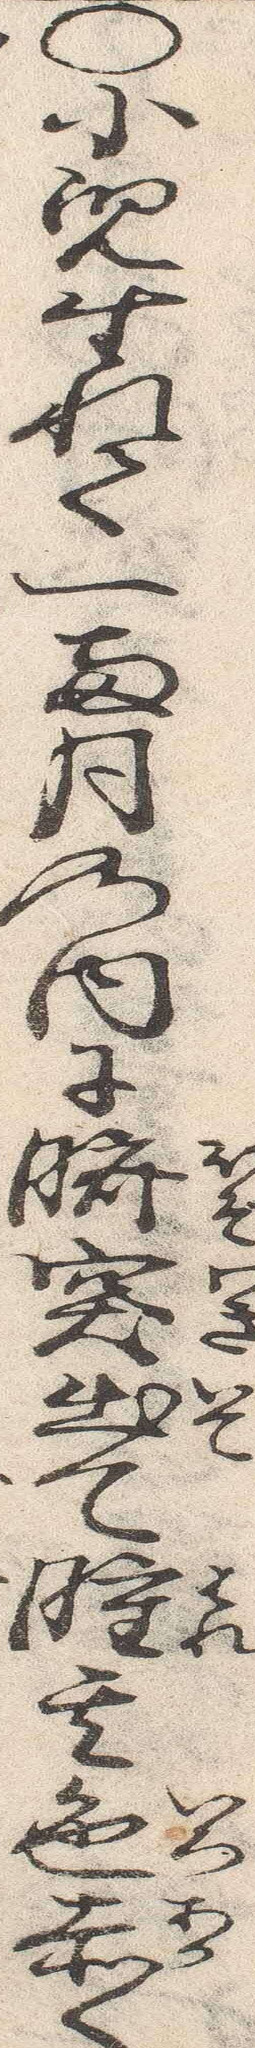○小児生れて一両月の内に臍突出て腫其色赤く
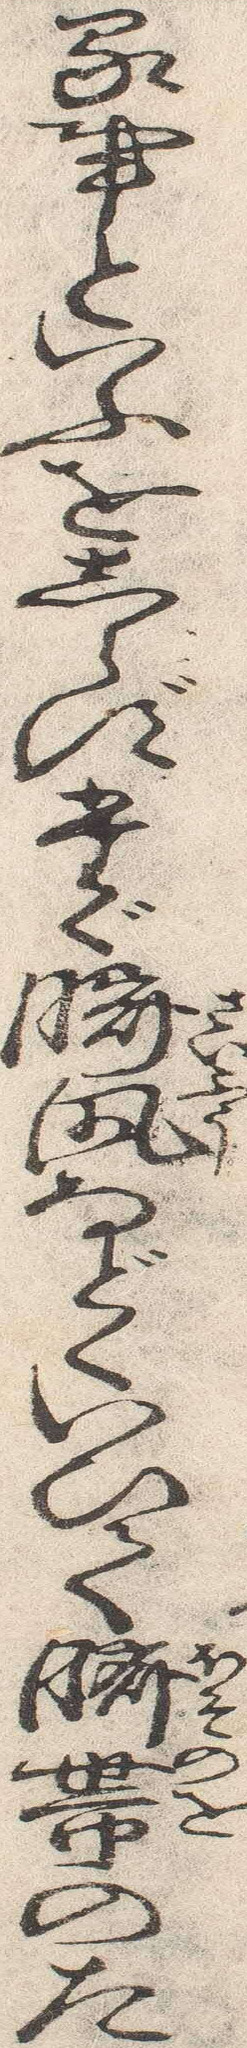る事といふをしらずたゞ臍風などゝいひて臍帯のた
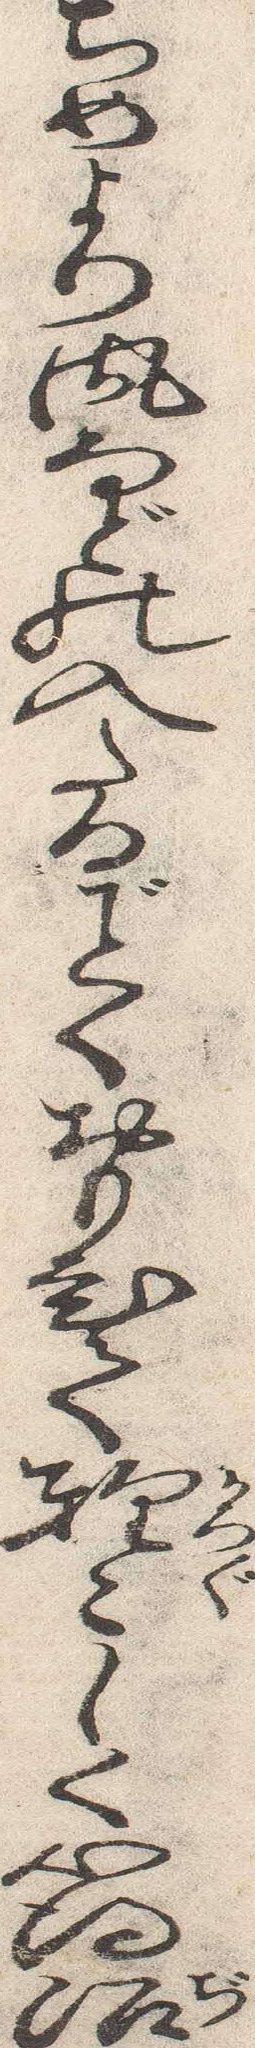ちめより風などの入たるごとくおもひて軽々しく心得治
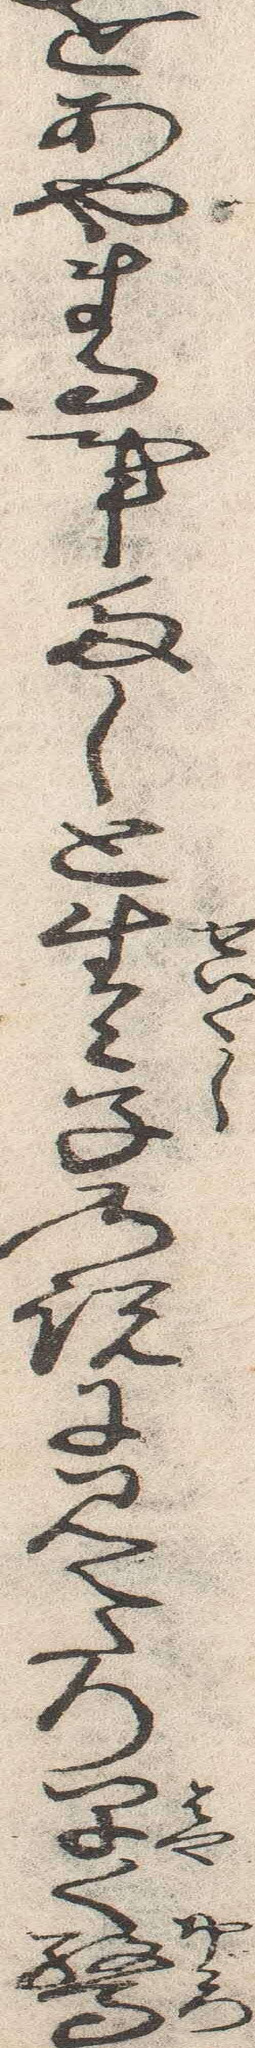をあやまる事多しと生々子の説に見えたり早く驚
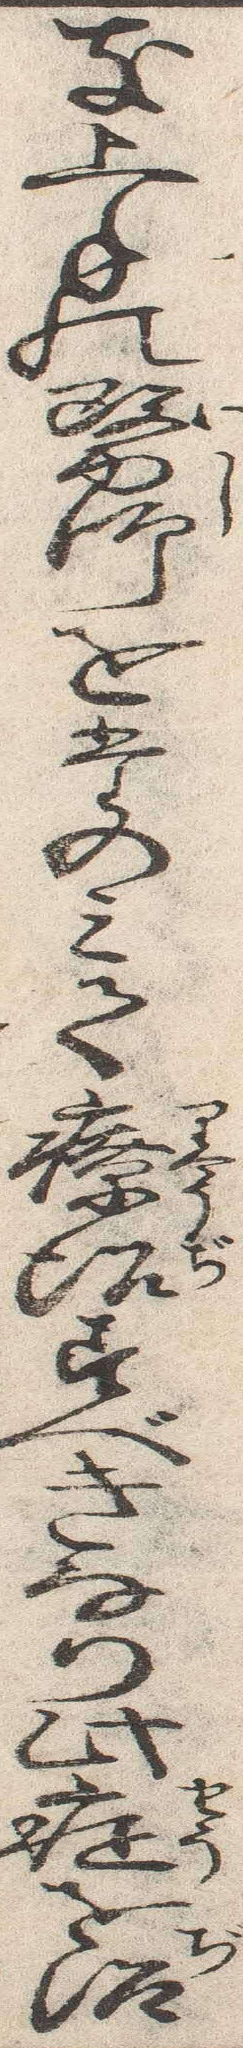き上手の医師をたのみて療治すべきなり此症を治
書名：小児必用養育草
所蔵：東京学芸大学附属図書館 国文学研究資料館
